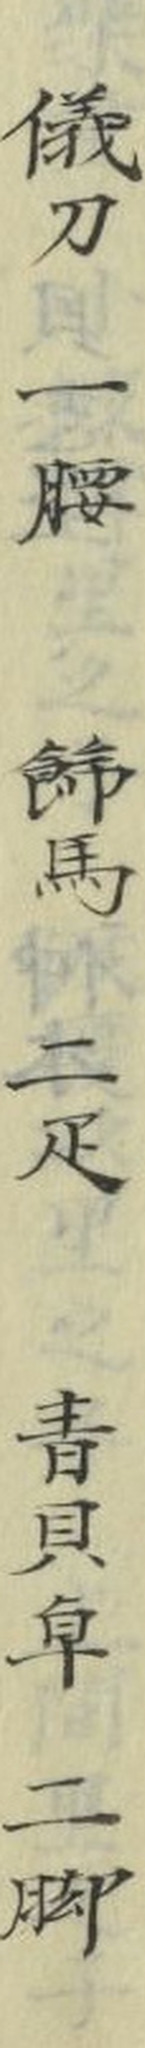儀刀一腰飾馬二疋青貝卓二脚
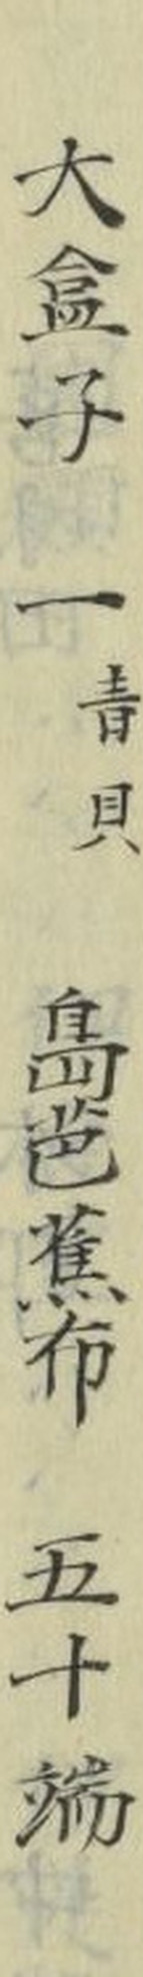大盒子一青貝島芭蕉布五十端
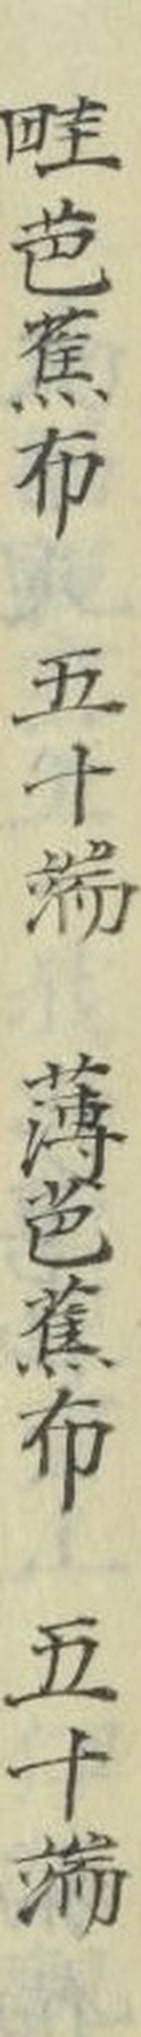畦芭蕉布五十端薄芭蕉布五十端
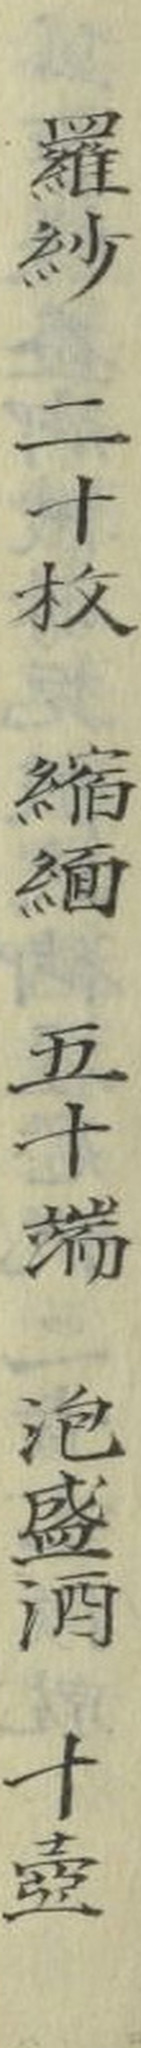羅紗二十枚縮緬五十端泡盛酒十壺
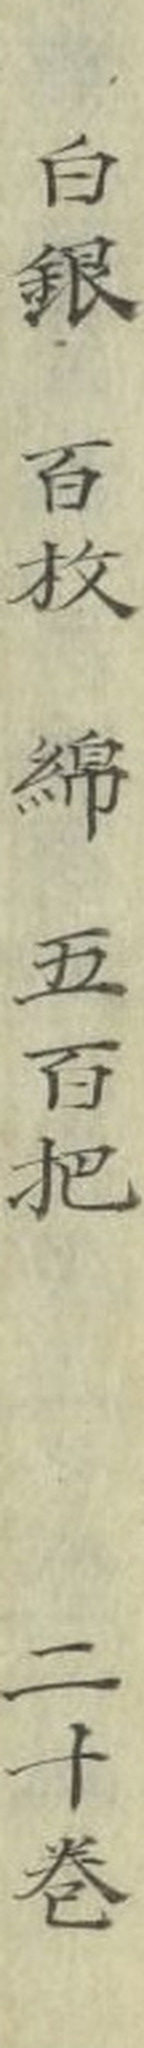白銀百枚綿五百把二十巻
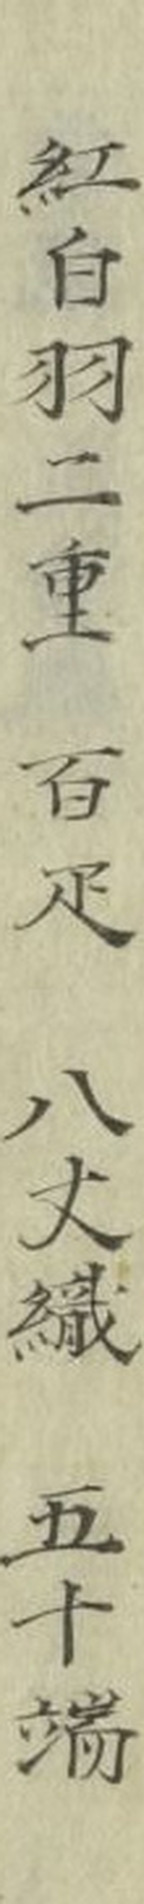紅白羽二重百疋八丈織五十端
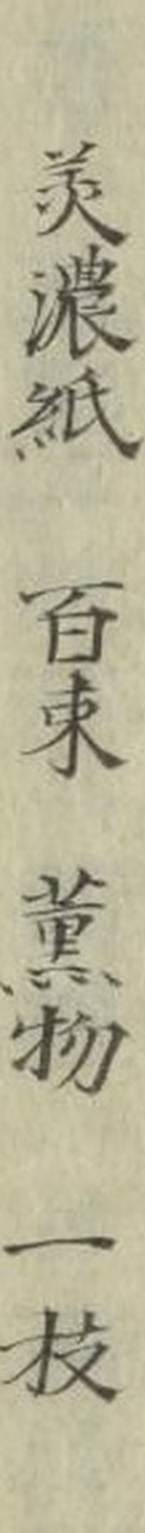美濃紙百束薫物一枝

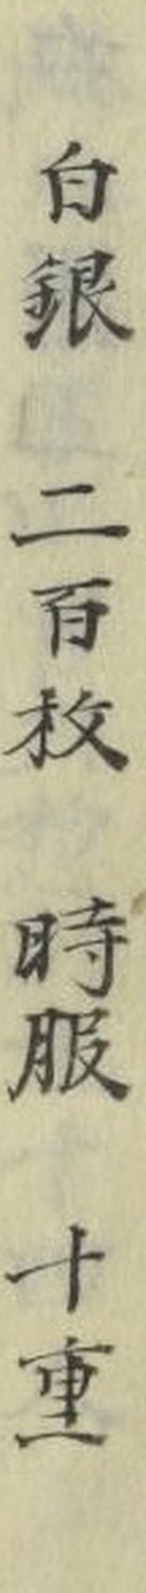白銀二百枚時服十重
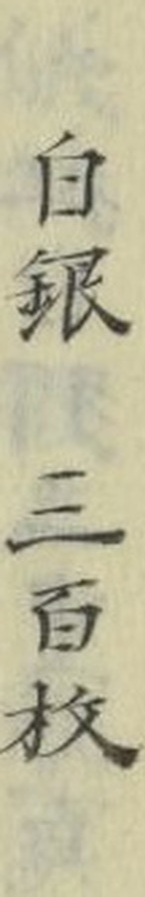白銀三百枚
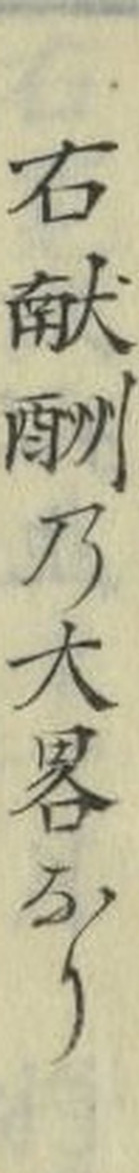右献酬の大略なり
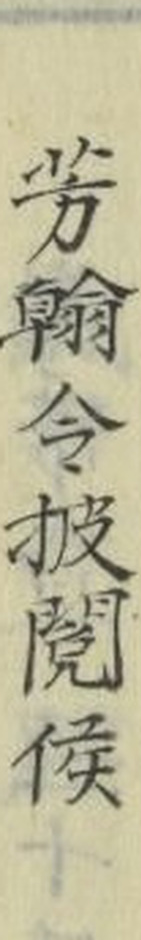芳翰令披閲侯
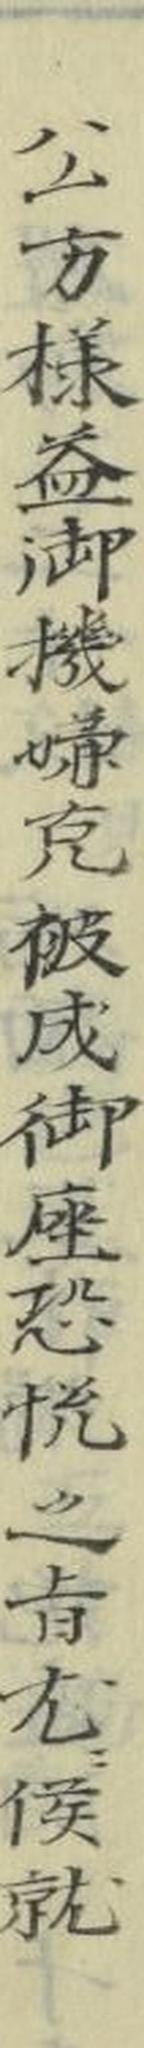公方様益御機嫌克被成御座恐悦之旨尤侯就
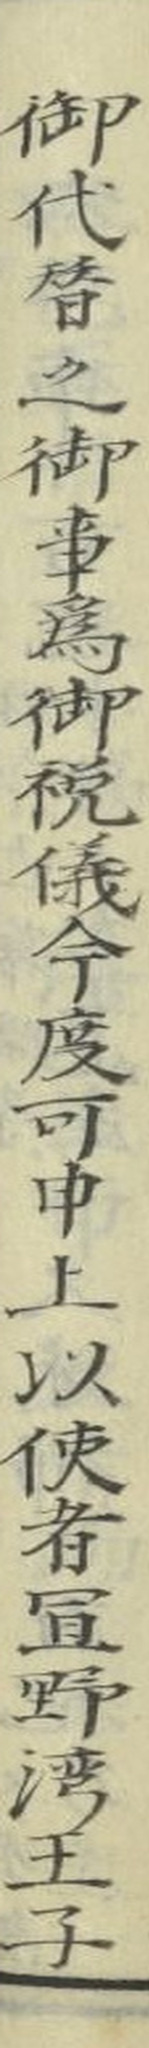御代替之御事為御祝儀今度可申上以使者宜野湾王子
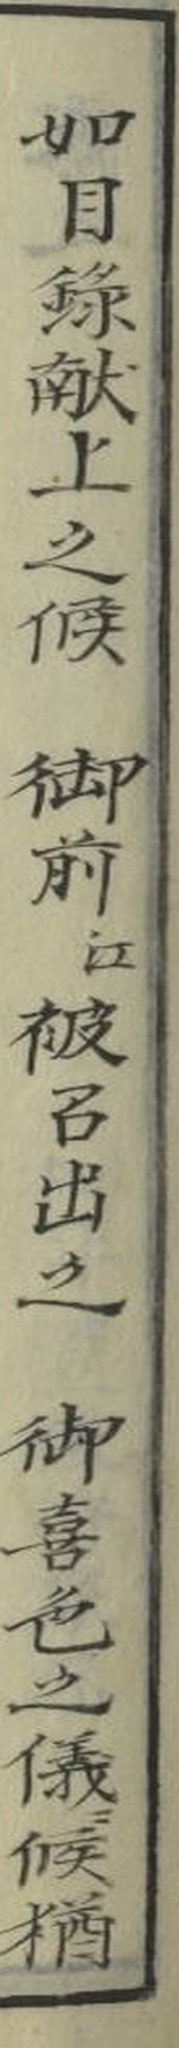如目録献上之候御前江被召出之御喜色之儀候猶
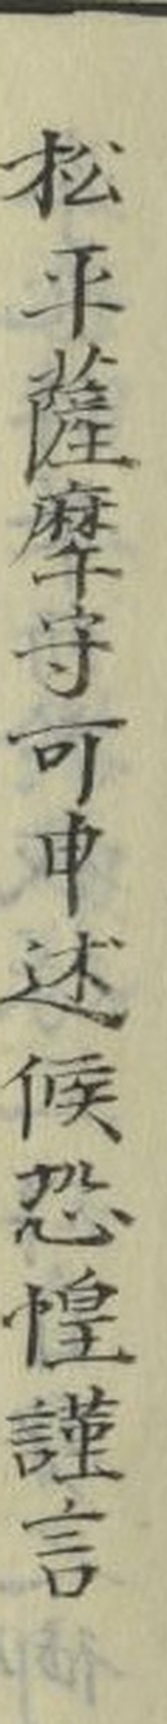松平薩摩守可申述候恐惶謹言
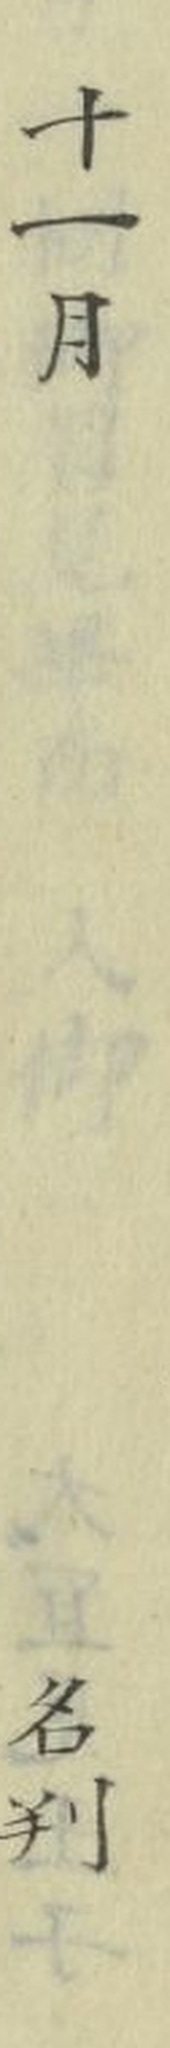十一月名判
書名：琉球沿革志 下
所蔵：University of the Ryukyus Library
